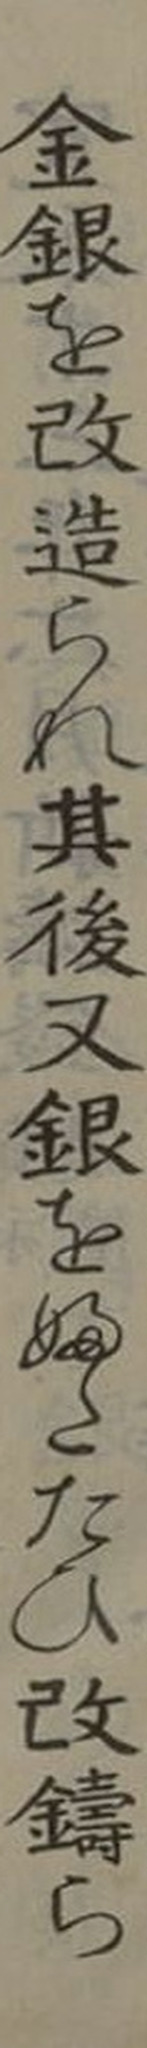金銀を改造られ其後又銀をふたたひ改鑄ら
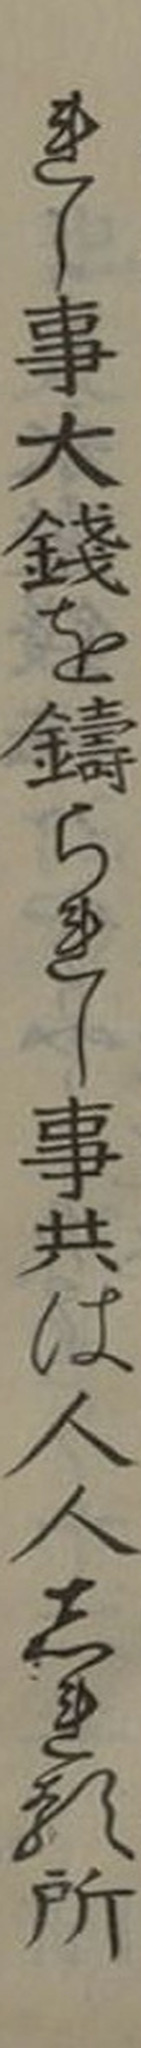れし事大錢を鑄られし事共は人人しれる所
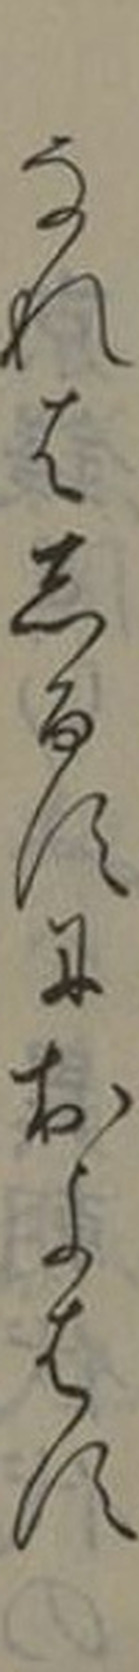なれはしるすにおよはす
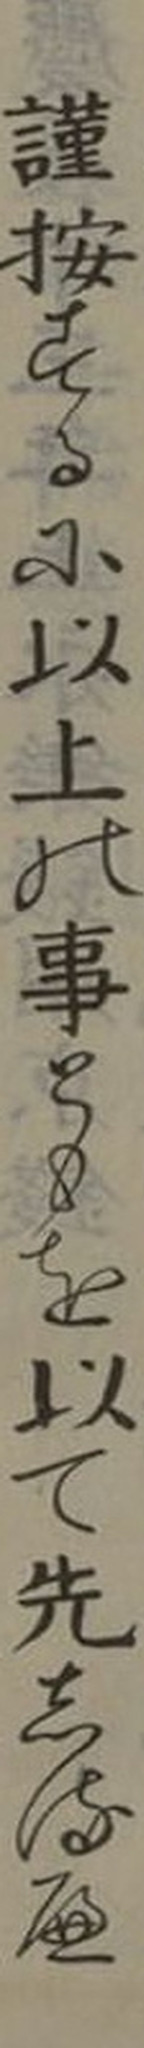謹按するに以上の事ともを以て先しるへ
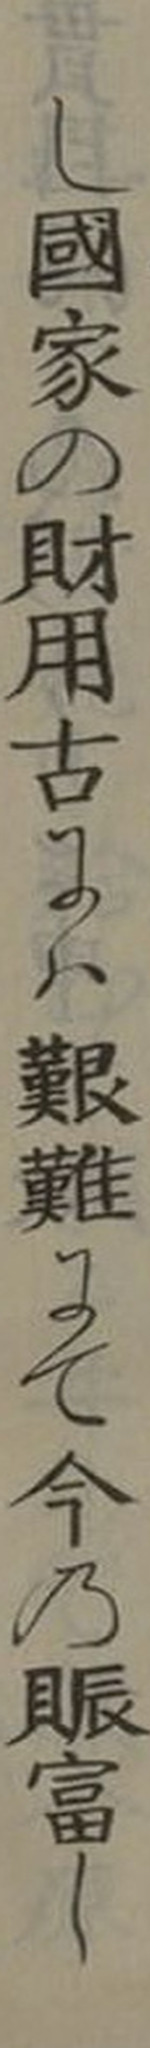し國家の財用古には艱難にて今の賑富し
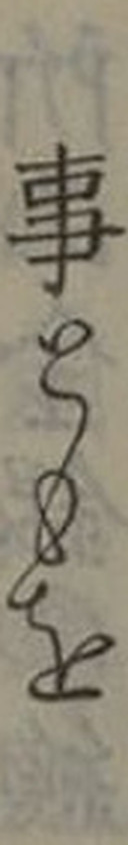事ともを
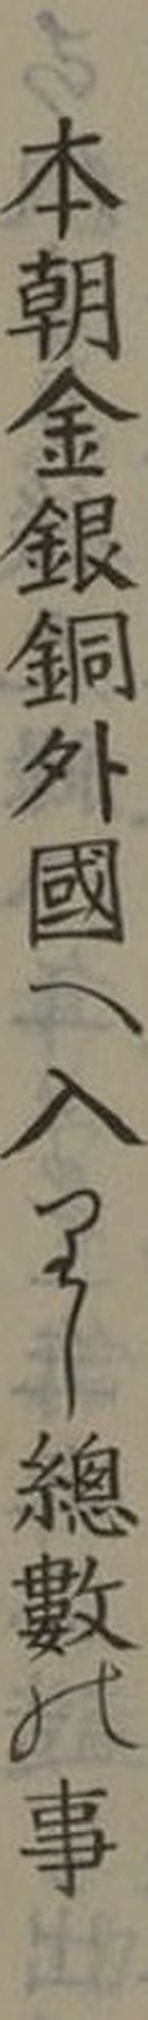本朝金銀銅外國へ入りし總數の事
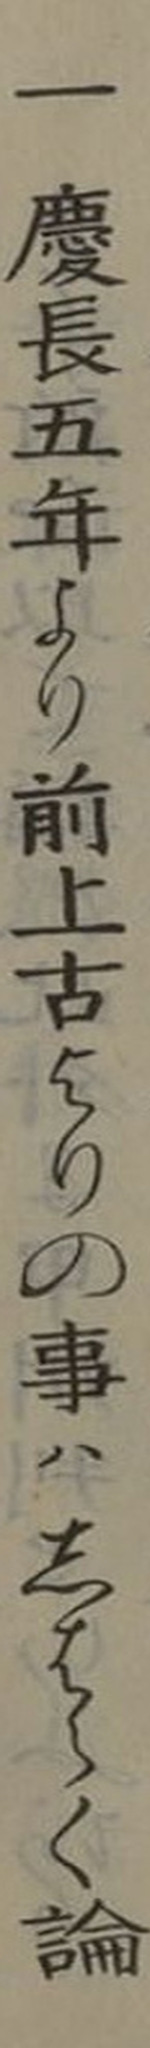一慶長五年より前上古よりの事はしはらく論
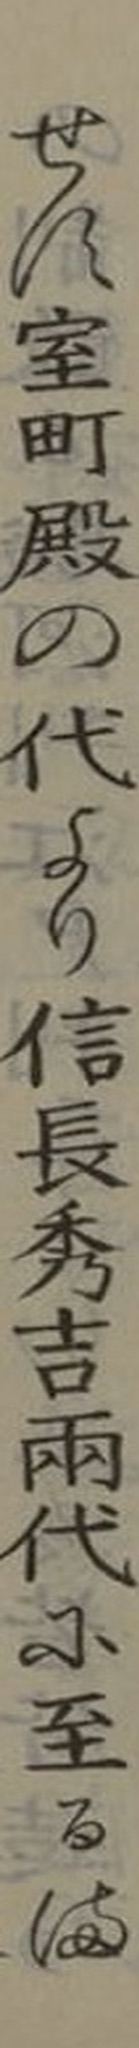せす室町殿の代より信長秀吉兩代に至るま
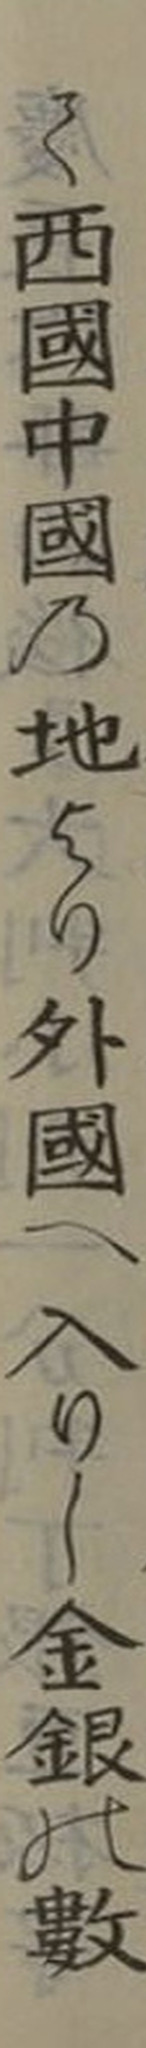て西國中國の地より外國へ入りし金銀の數
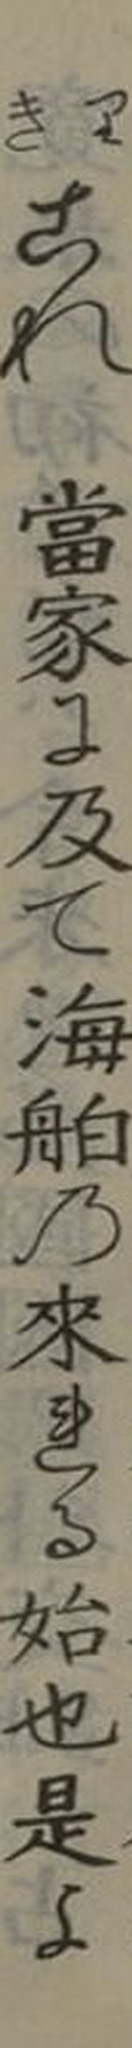りきこれ當家に及て海舶の來れる始也是よ
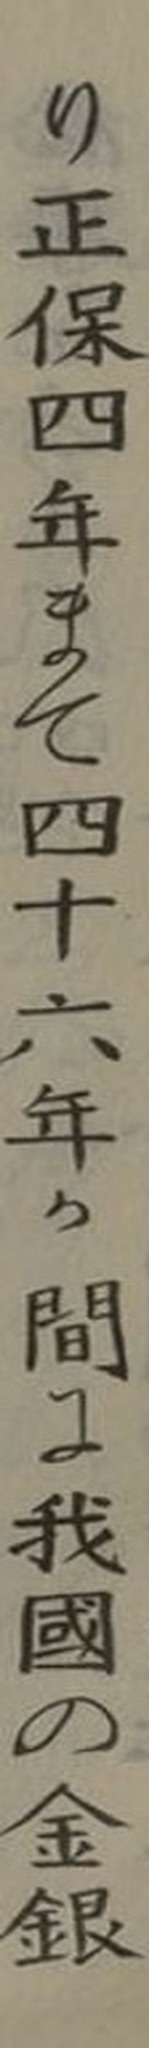り正保四年まて四十六年か間に我國の金銀
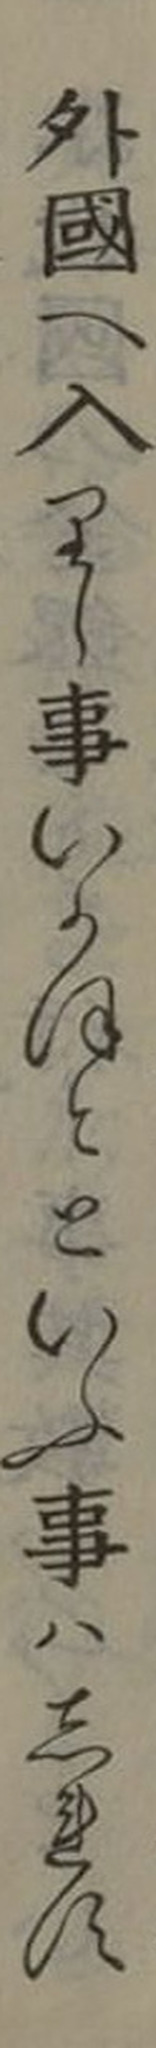外國へ入りし事いかほとといふ事はしれす
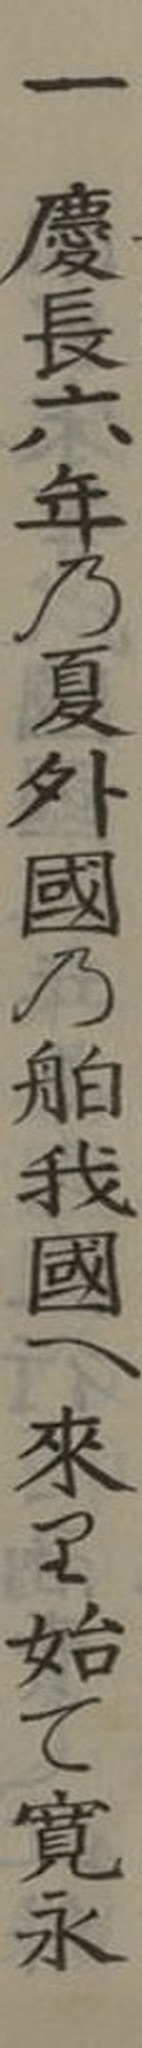一慶長六年の夏外國の舶我國へ來り始て寛永
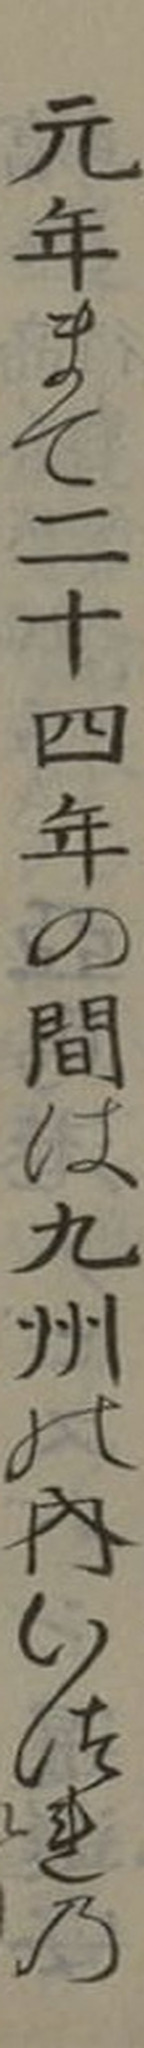元年まて二十四年の間は九州の内いつれの
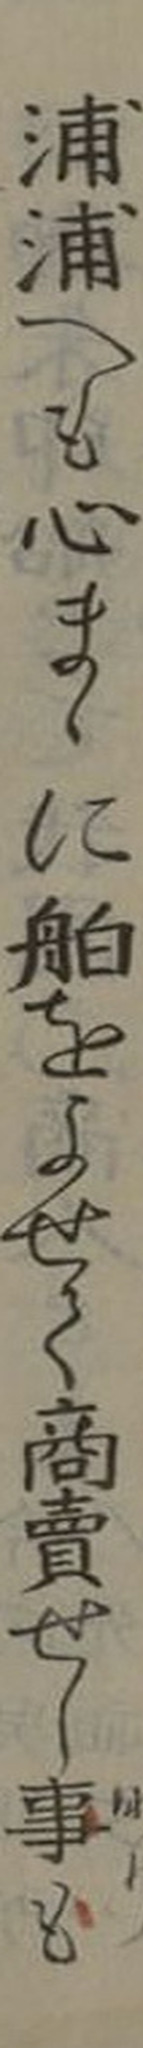浦浦へも心まゝに舶をよせて商賣せし事も
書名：骨董録
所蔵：University of the Ryukyus Library
